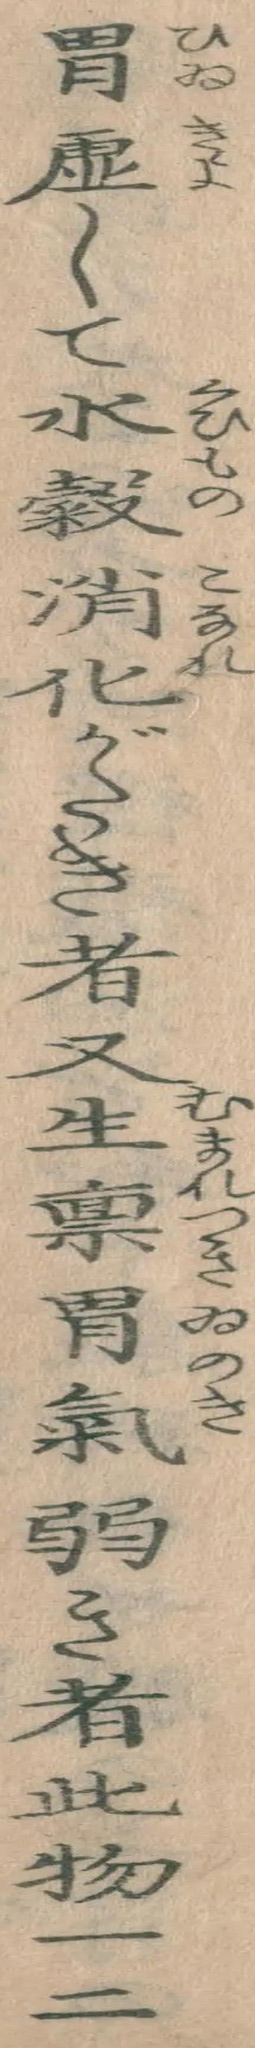胃虚して水穀消化がたき者又生稟胃気弱き者此物一二

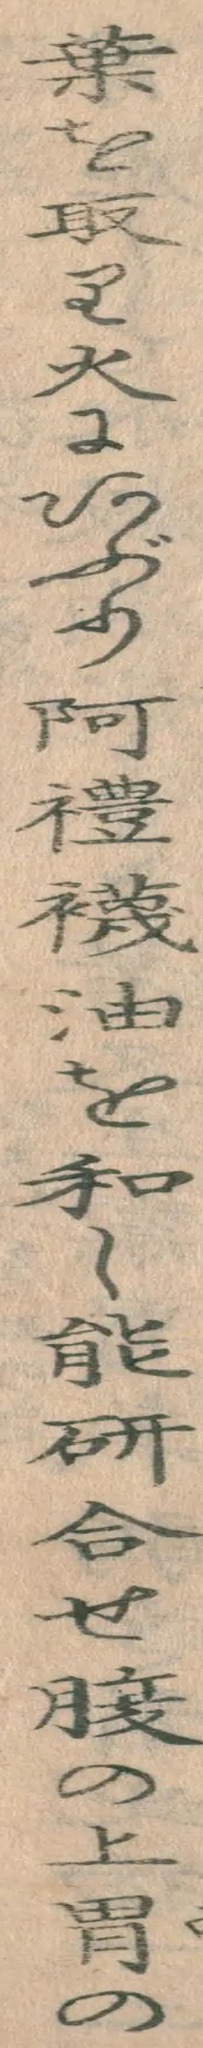葉を取り火にあぶり阿礼襪油を和し能研合せ腹の上胃の
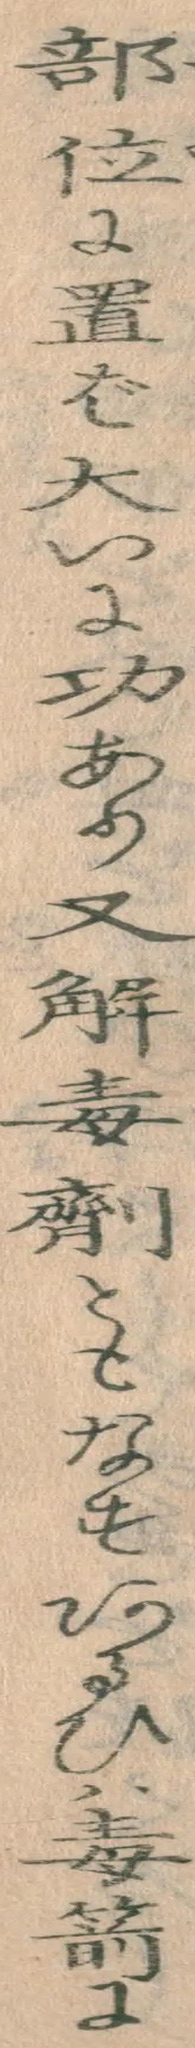部位に置ば大いに功あり又解毒剤ともなすあるひは毒箭に
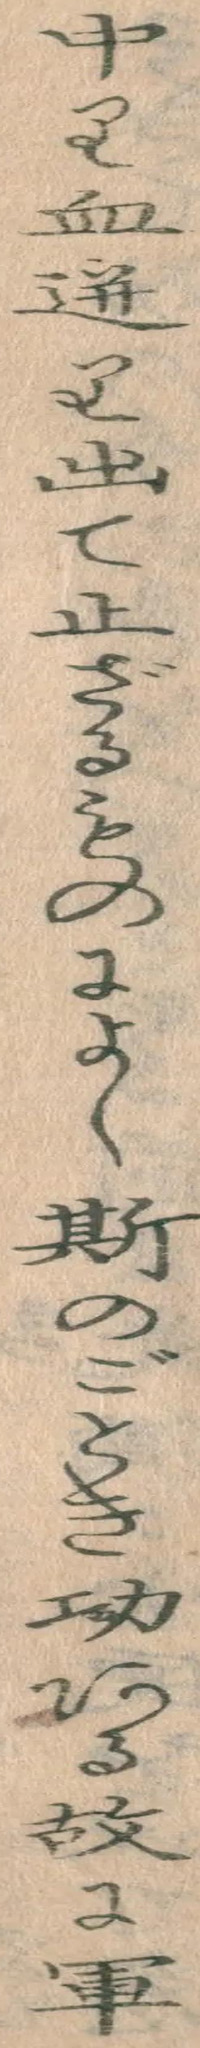中り血迸り出て止ざるものによし斯のごとき功ある故に軍
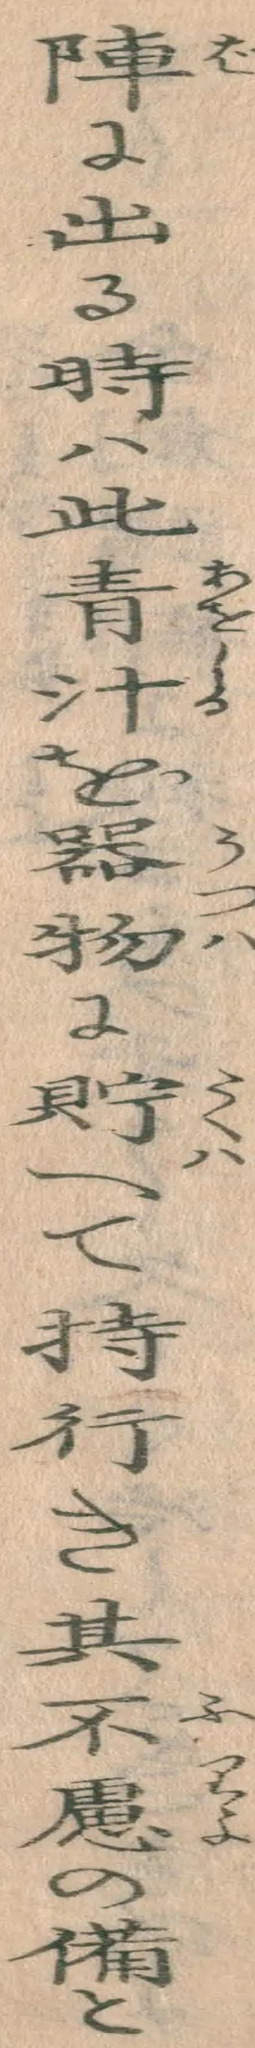陣に出る時は此青汁を器物に貯へて持行き其不慮の備と
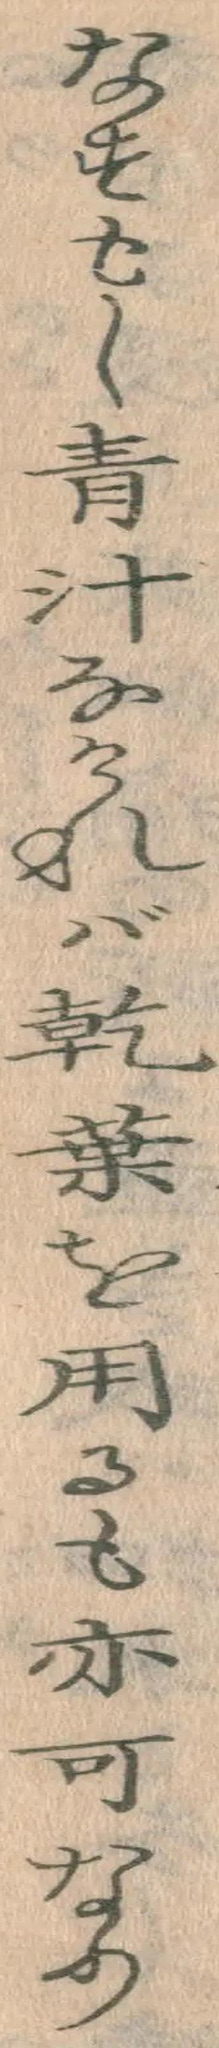なすもし青汁なければ乾葉を用るも亦可なり
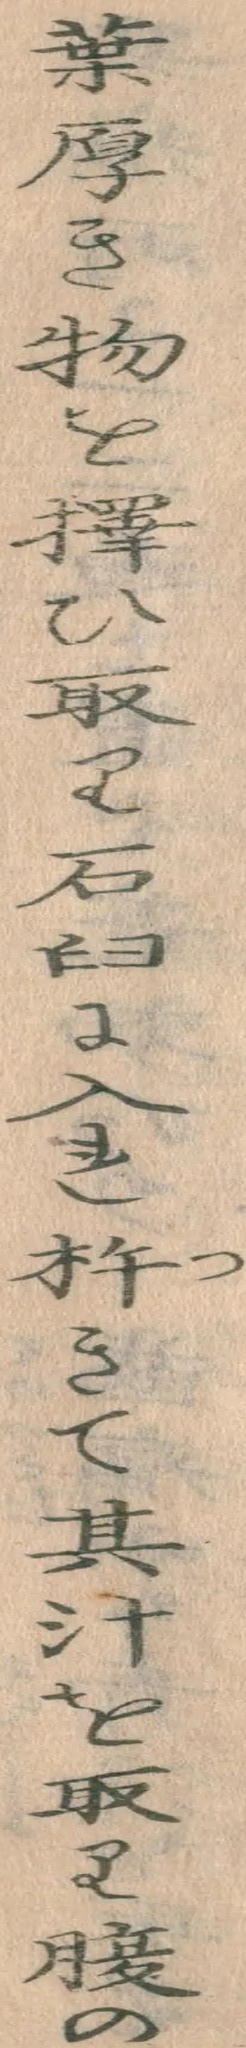葉厚き物を択ひ取り石臼に入れ杵きて其汁を取り腹の
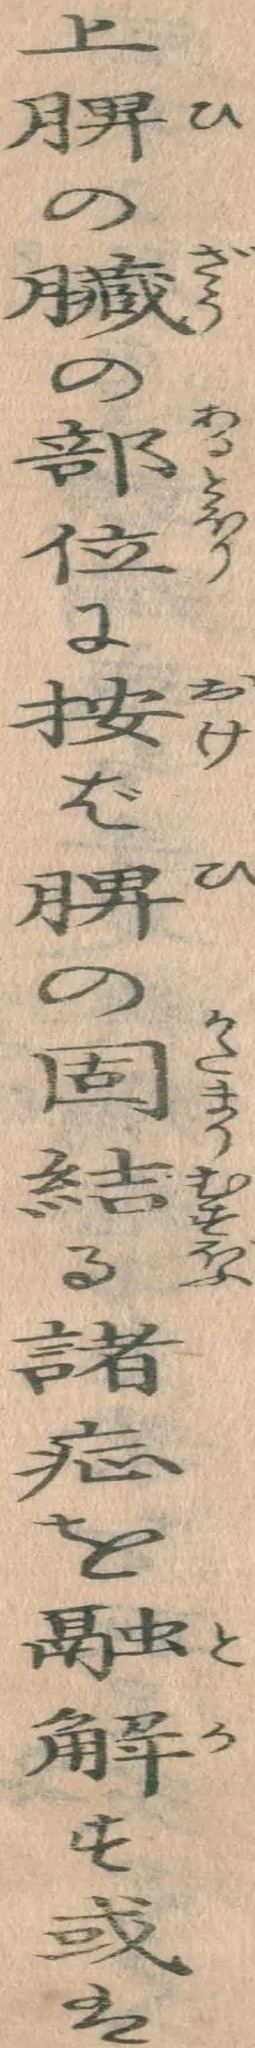上脾の臓の部位に按ば脾の固結る諸症を融解す或は
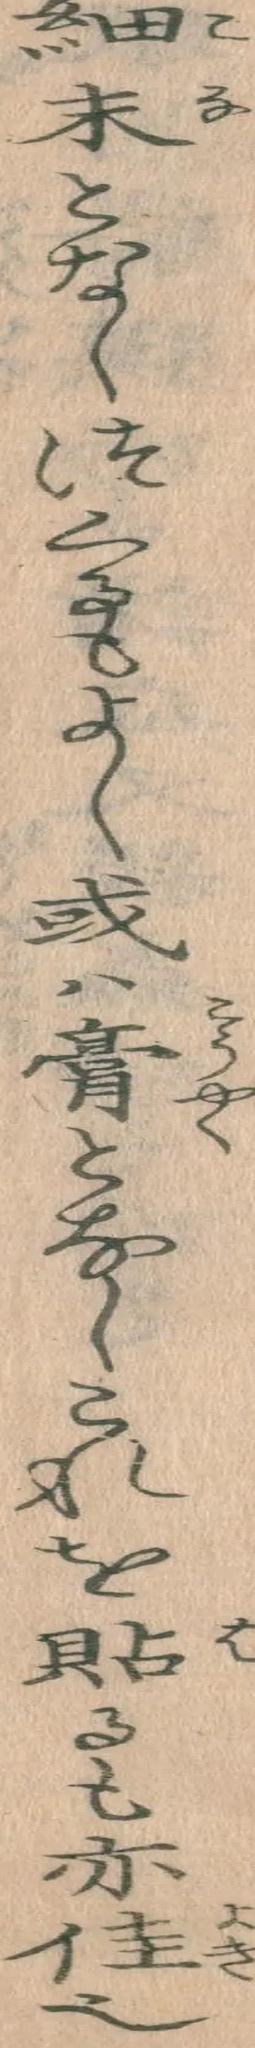細末となしつくるもよし或は膏となしこれを貼るも亦佳也
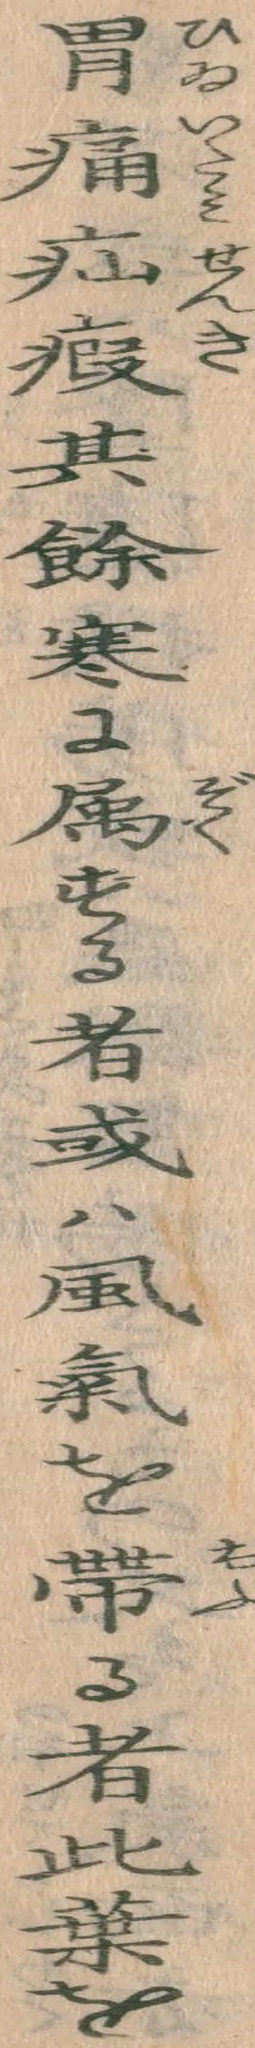胃痛疝瘕其余寒に属する者或は風気を帯る者此葉を
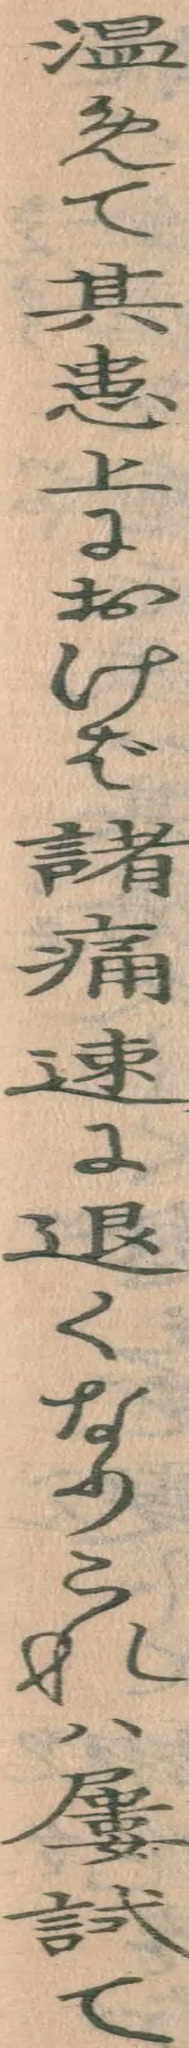温めて其患上におけば諸痛速に退くなりこれは屡試て
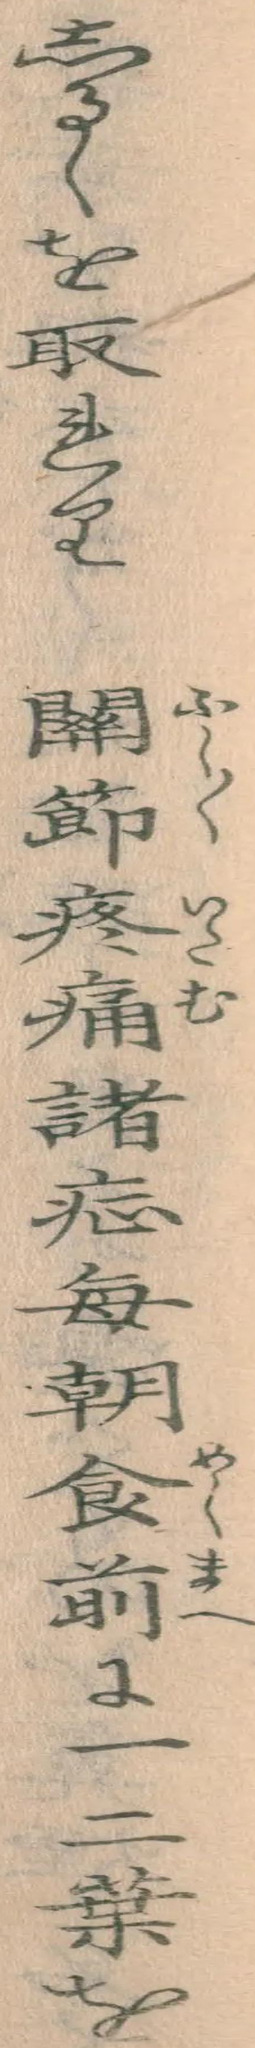しるしを取れり関節疼痛諸症毎朝食前に一二葉を
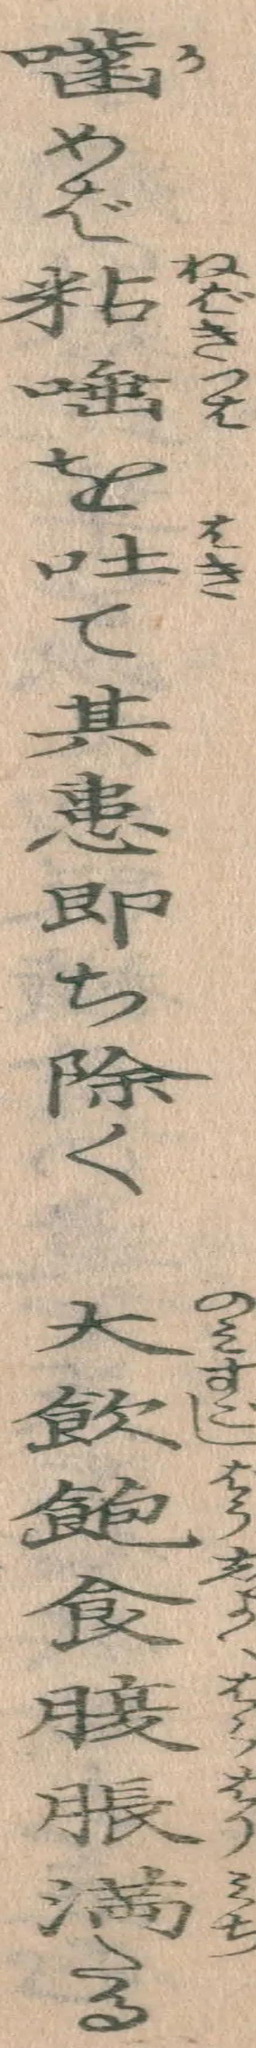嚙めば粘唾を吐て其患即ち除く大飲飽食腹脹満たる
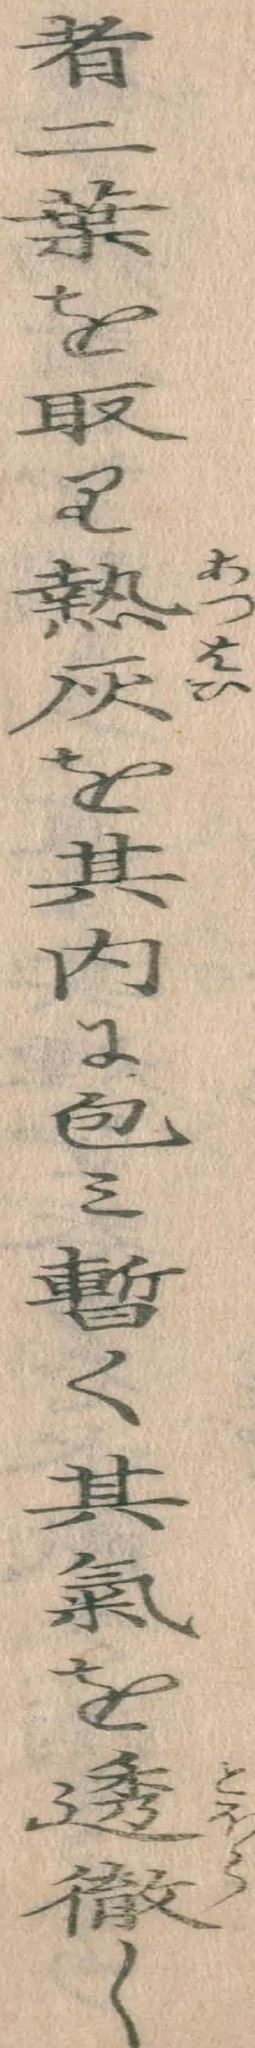者二葉を取り熱灰を其内に包み暫く其気を透徹し
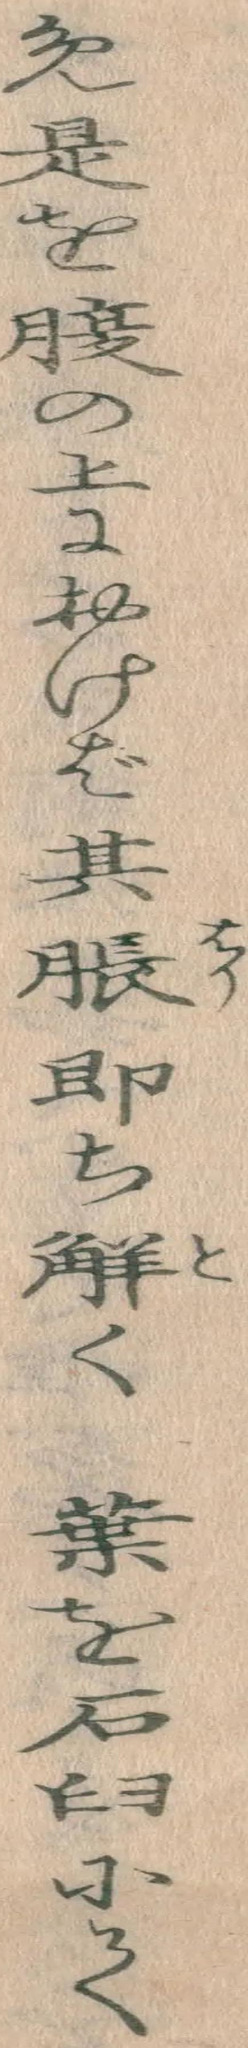め是を腹の上におけば其脹即ち解く葉を石臼にて
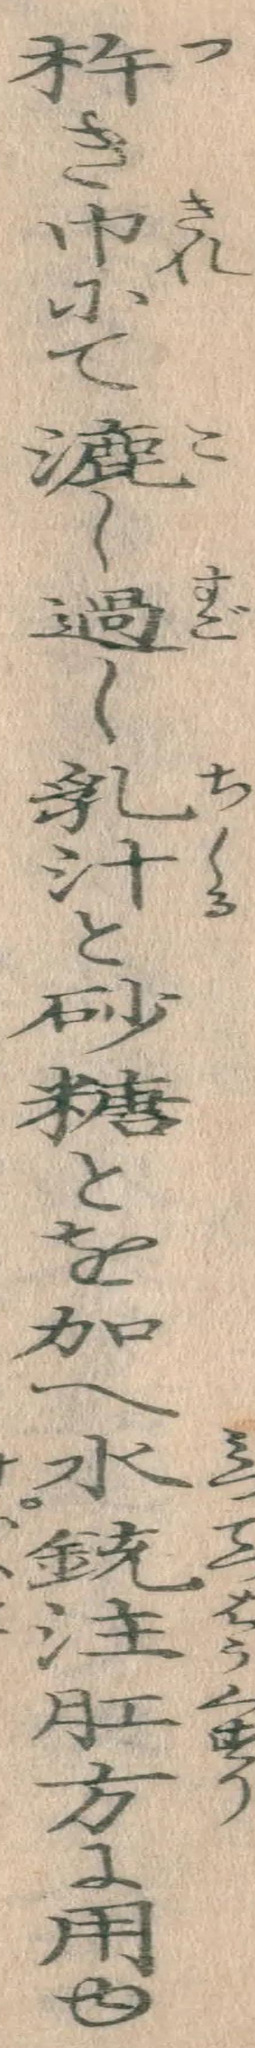杵き巾にて漉し過し乳汁と砂糖とを加へ水銃注肛方に用ゆ
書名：目さまし草
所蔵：国立国会図書館 National Diet Library, JAPAN
